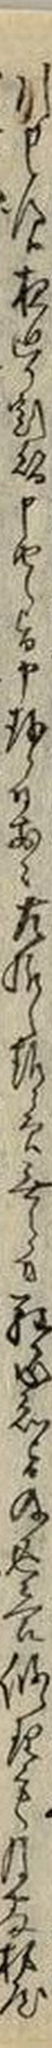引申候得は夜廻り割替申聞候旨申越候付前々左様之趣にては無之に付難承知旨及返答修理方へ月番杤谷
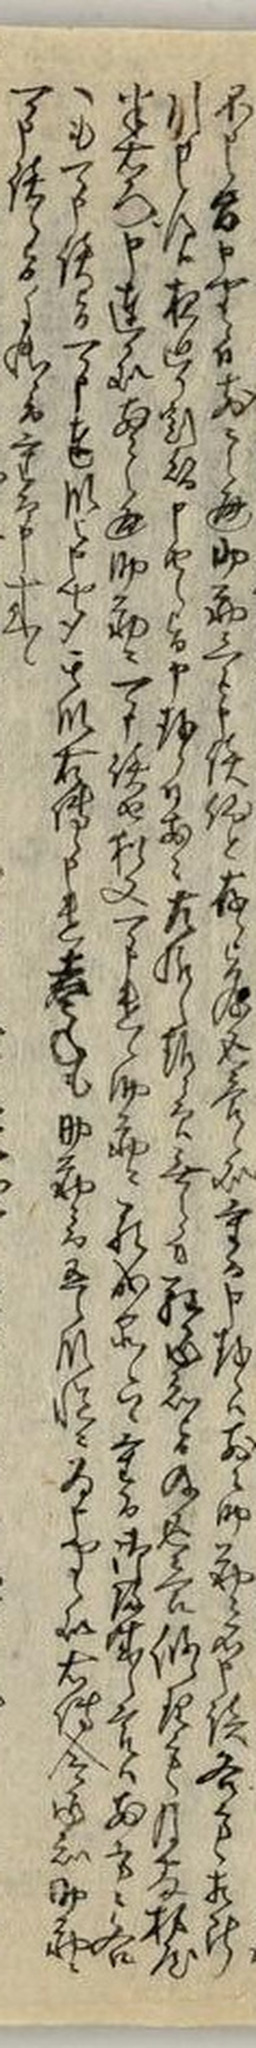半右衛門申達候処前々之通助勤に可申談由猶又可申遣候助勤に難成品候はゝ重て御帰城之節は前方に各
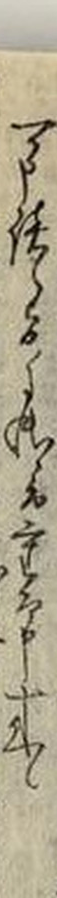可申談之旨手紙にて重て申来候
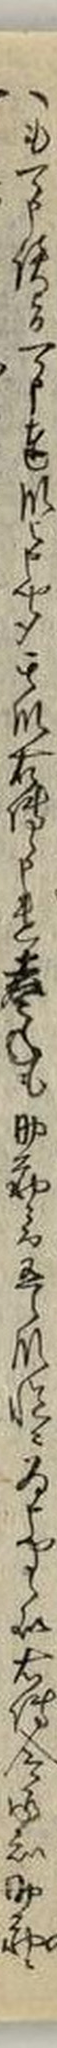へも可申談候旨可申達段被申聞其段右伝へ申遣去年も助勤にて有之段慥に為申聞候処右伝令承知助勤に
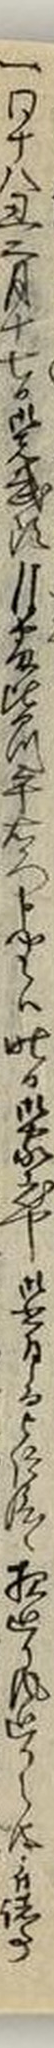一同十八丑二月十七日御先武頭月番皆川平右衛門申聞候は昨日御家老中御書付にて被仰渡候夜廻り風廻り之儀に付諸事
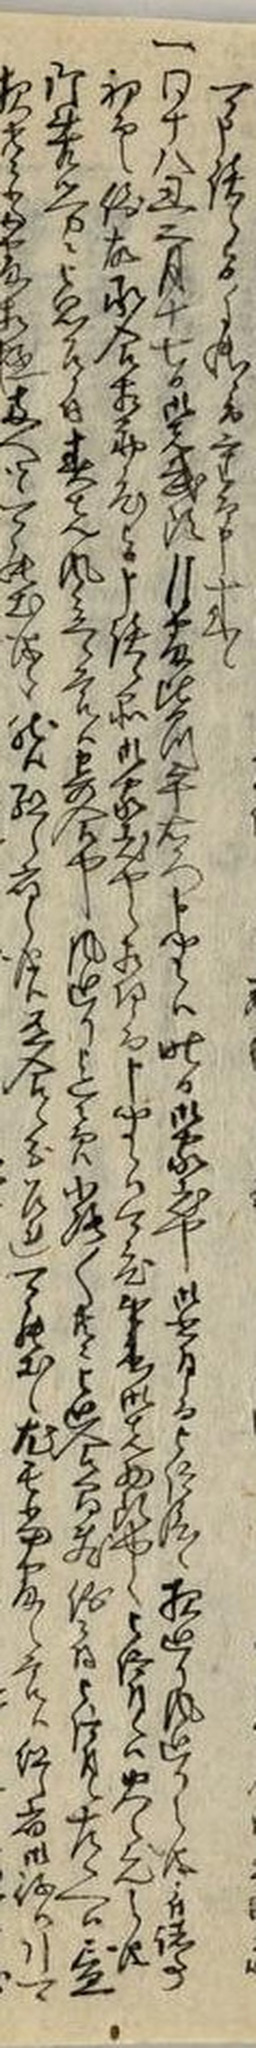初て之儀故承合相勤度旨申談候品御家老中へ相伺候て申聞候は今度御先物頭中へ被仰付候は火之元之儀
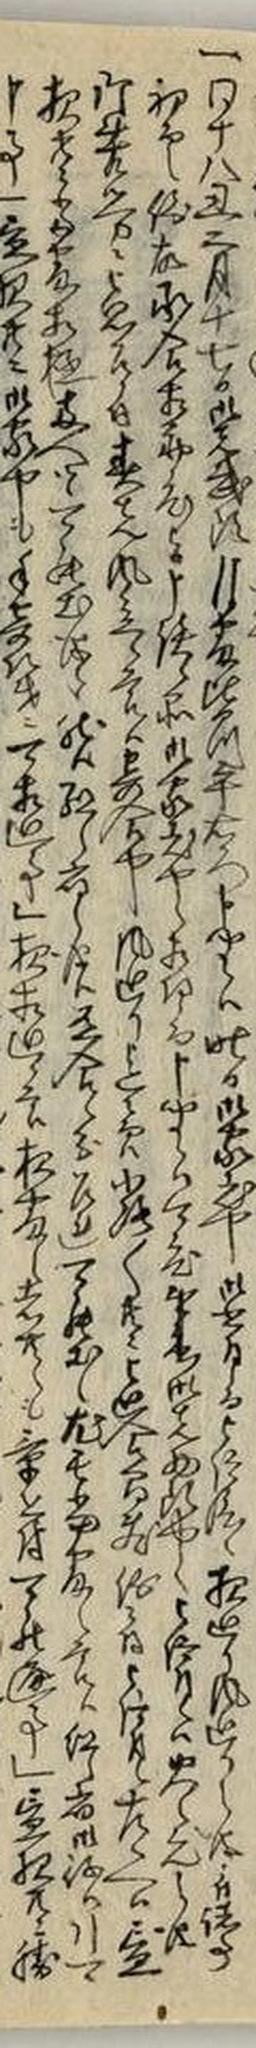御苦労に被思召候付春先風立候節は寄合中風廻り迄にては小路〳〵共に被廻合間敷儀に付被仰付候左候へは昼
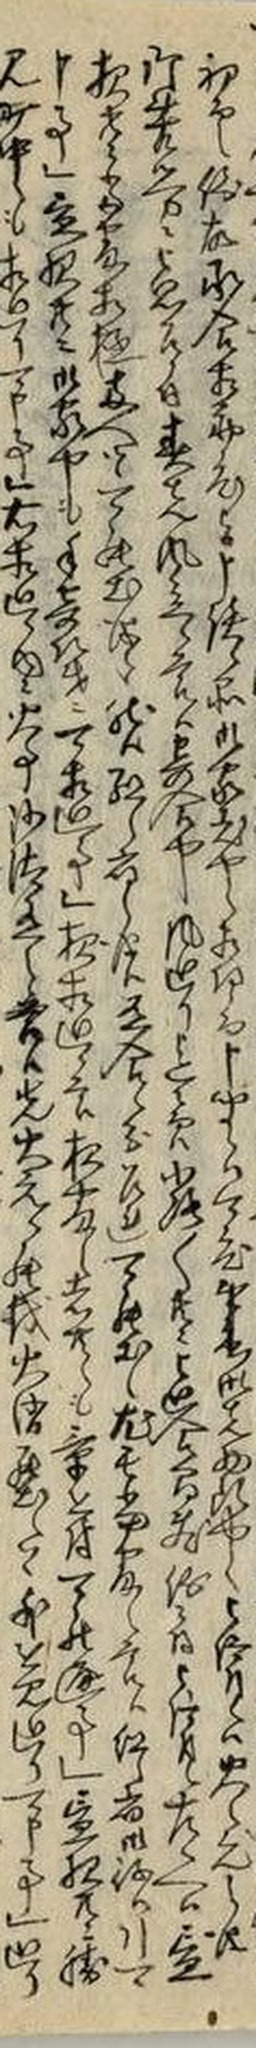夜共に当番相極両人ツヽ可罷出儀に候然は組之者之儀は有合候分召連可罷出候尤其当番之節は組之者御役は引可
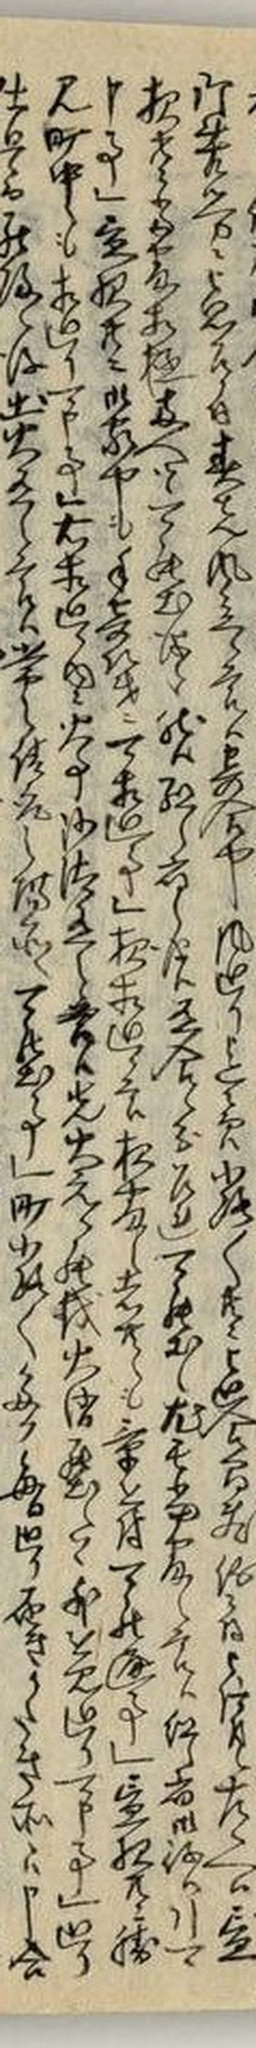申事」昼夜共に御家中も手寄次第に可相廻事」夜相廻候節夜番之者共へも気を付可罷通事」昼夜共に勝
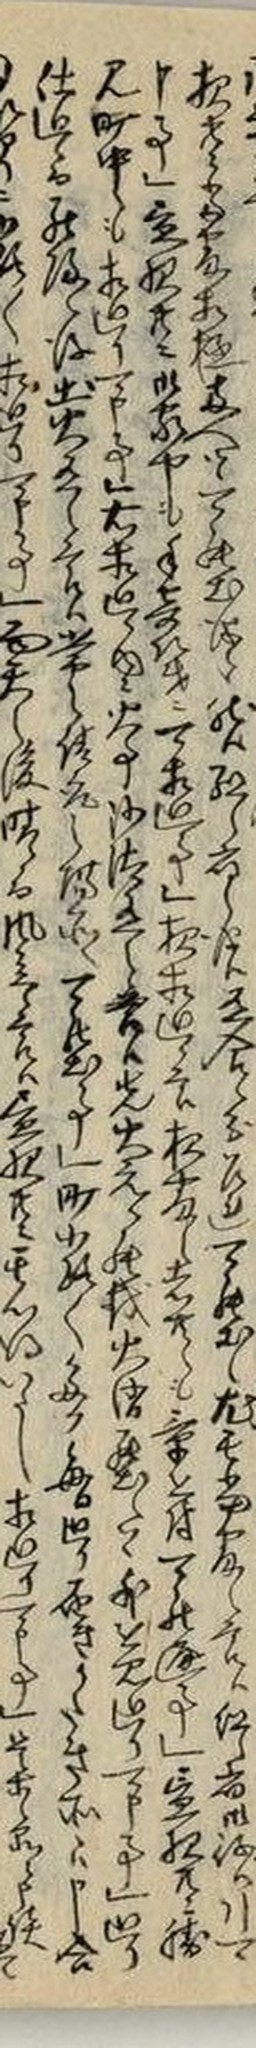見町中へも相廻り可申事」右相廻候内に火事沙汰有之候節は先火元へ罷越火消罷出候はゝ外を見廻り可申事」廻り
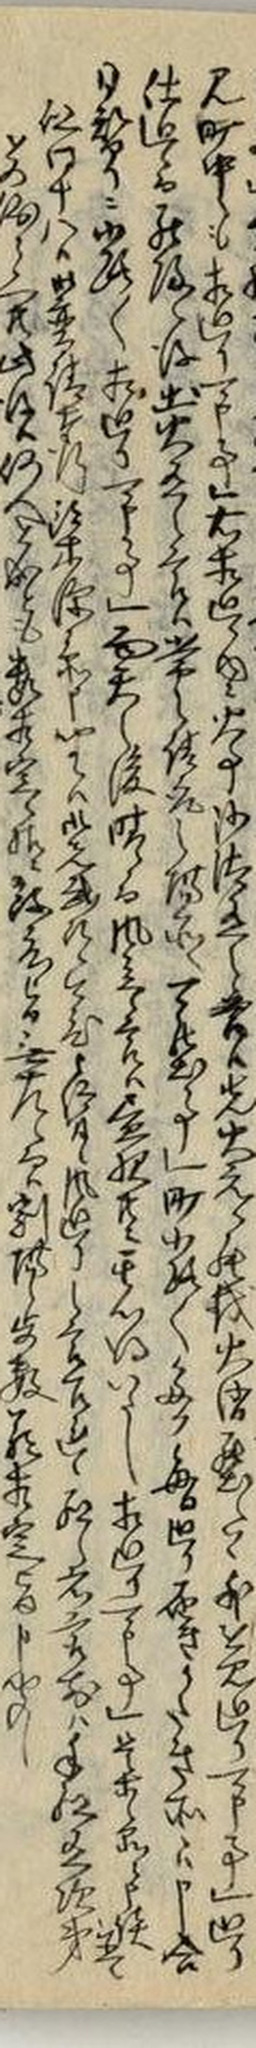日替りに小路〳〵相廻り可申事」雨天之後晴候て風立候節は昼夜共に其心得いたし相廻り可申事」是等之品々申談置候
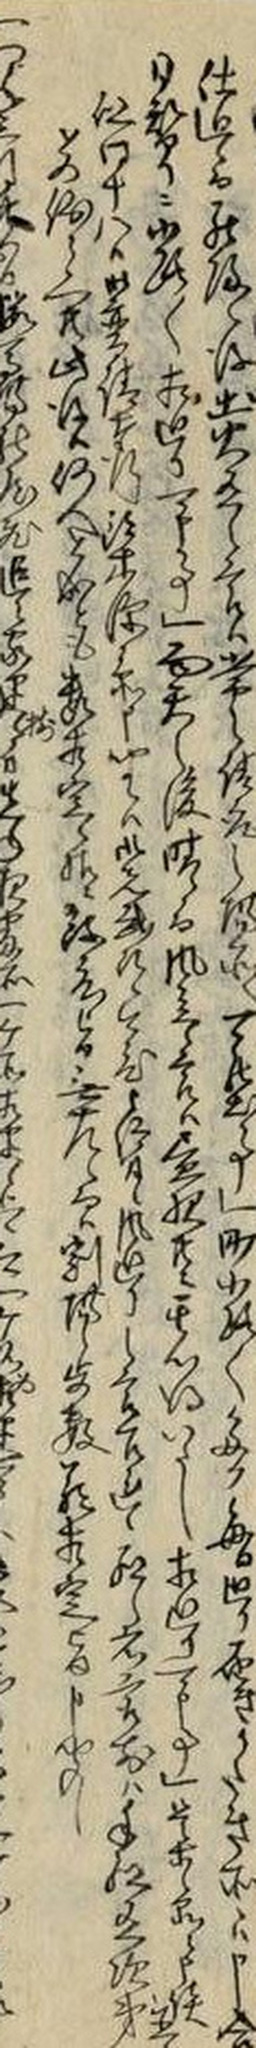但同十八日御普請奉行鈴木源兵衛申聞候は御先武頭へ今度被仰付候風廻り之節召連候組之者最前は手組有次第
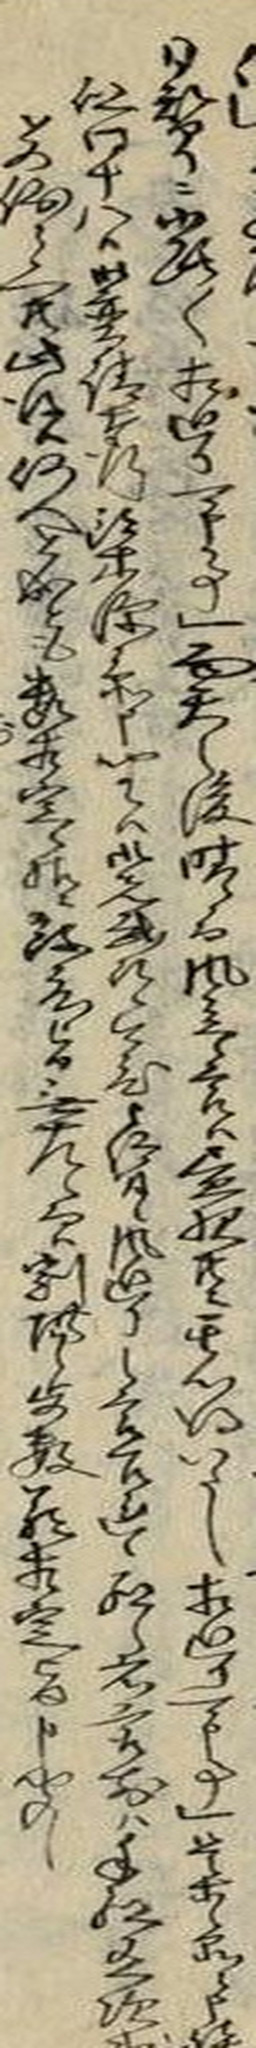との儀に候へ共此後は何人と成とも数相定候様に致度旨無左候ては割場之歩数難相定旨申聞候
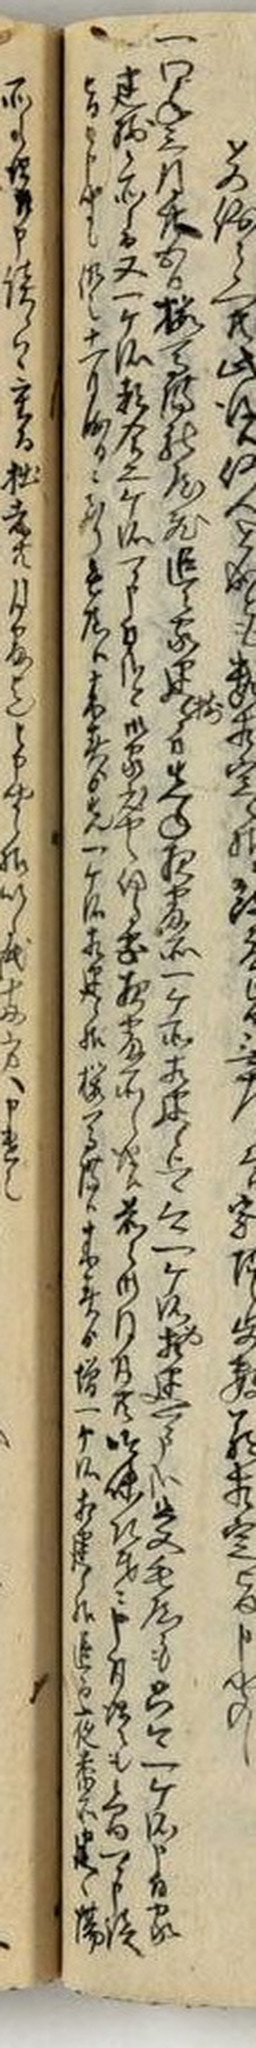建揃候所にて又一ケ所都合二ケ所可申付哉と御家老中へ伺候処夜番所之儀は前々御目付共吟味次第に申付儀にも候間可申談
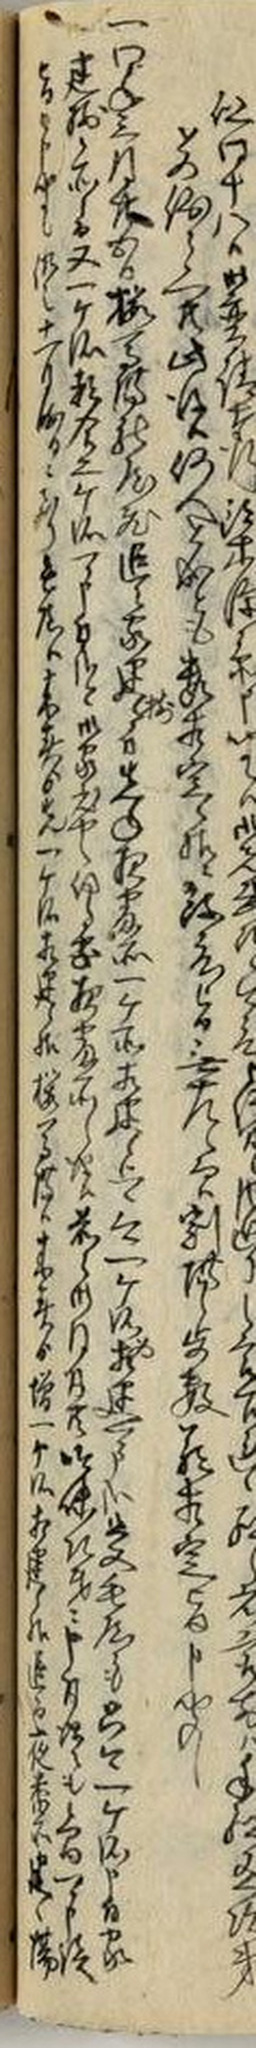一同年三月廿五日桜馬場新屋敷追々家建揃候に付先年夜番所一ケ所相建候上へ今一ケ所為相建可申哉且又毛屋にも只今一ケ所申付家
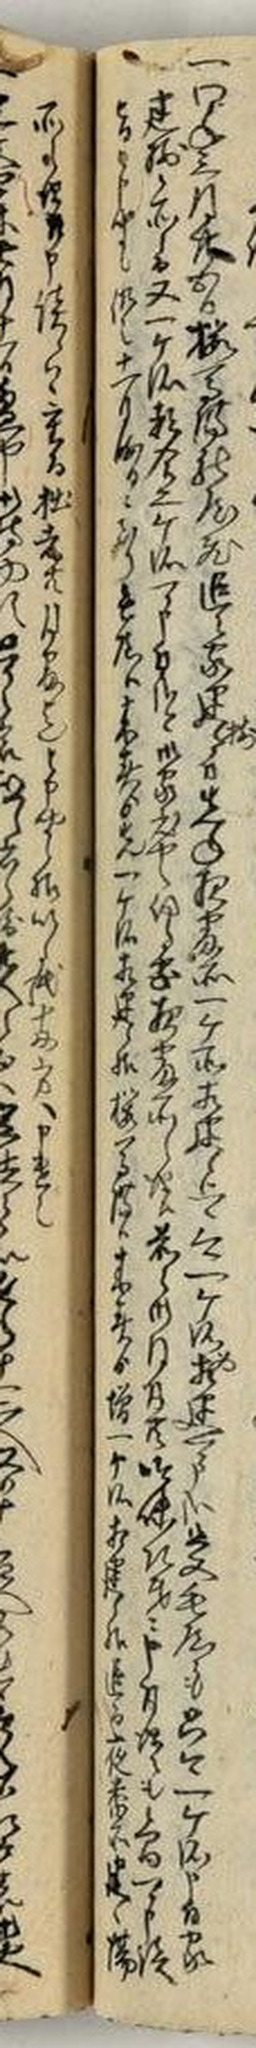旨被申聞候仍之十一月晦日に至り毛屋は来春ゟ先一ケ所相建候様桜馬場は来春ゟ増一ケ所相建候様追て夜番所建候場
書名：御城下諸事之部
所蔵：福井県文書館 Fukui Prefectural Archives
